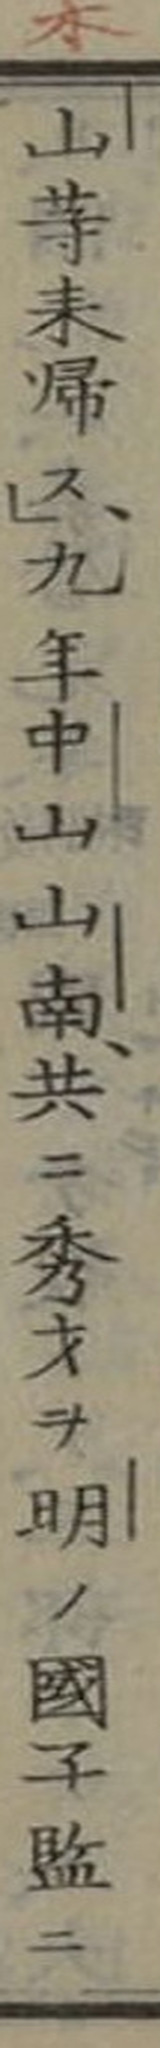山等来帰ス、」九年中山山南、共ニ秀才ヲ明ノ国子監ニ
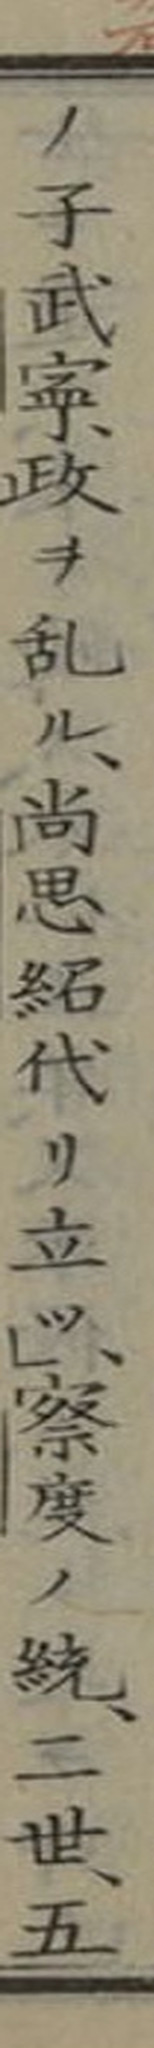ノ子武寧、政ヲ乱ル、尚思紹代リ立ツ、」察度ノ統、二世、五
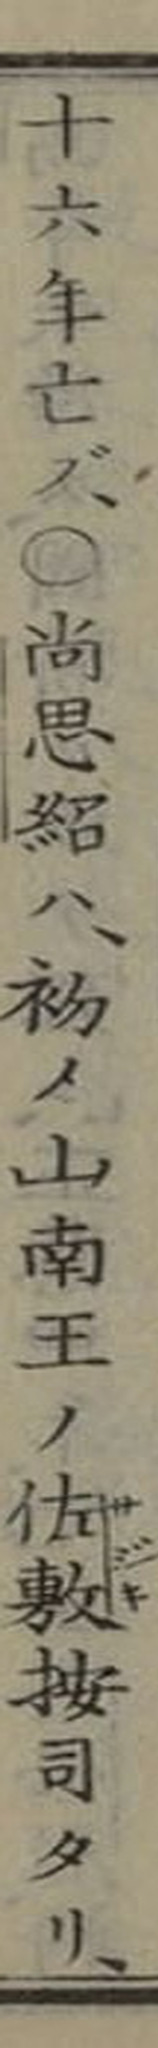十六年亡ブ、○尚思紹ハ、初メ山南王ノ佐敷按司タリ、
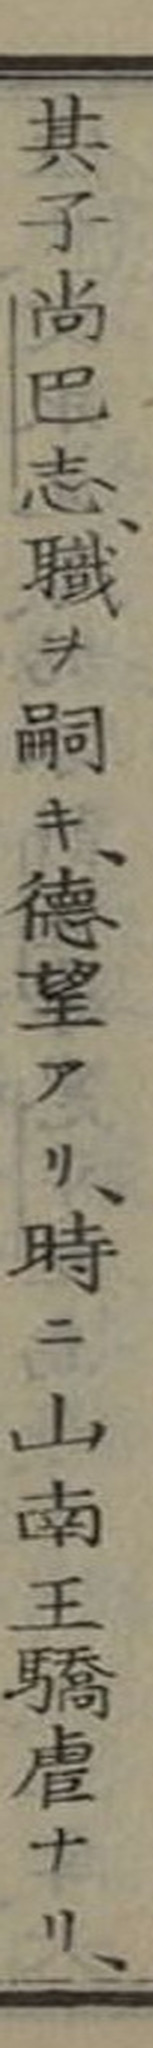其子尚巴志、職ヲ嗣キ、徳望アリ、時ニ山南王驕虐ナリ、
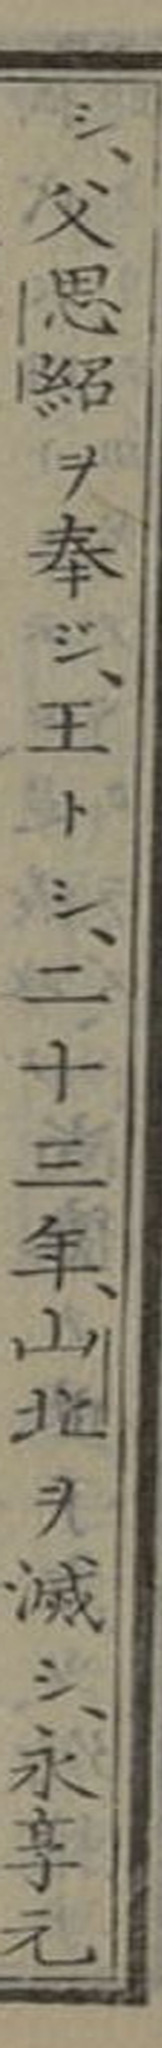シ、父思紹ヲ奉ジ、王トシ、二十三年、山北ヲ滅シ、永享元
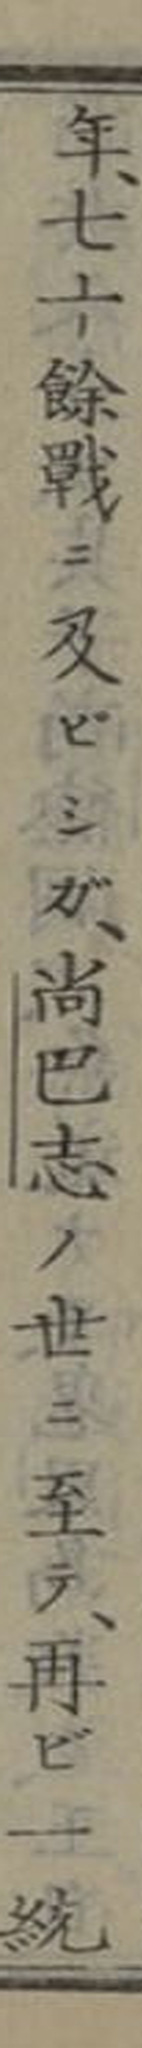年、七十余戦ニ及ビシガ、尚巴志ノ世ニ至テ、再ビ一統
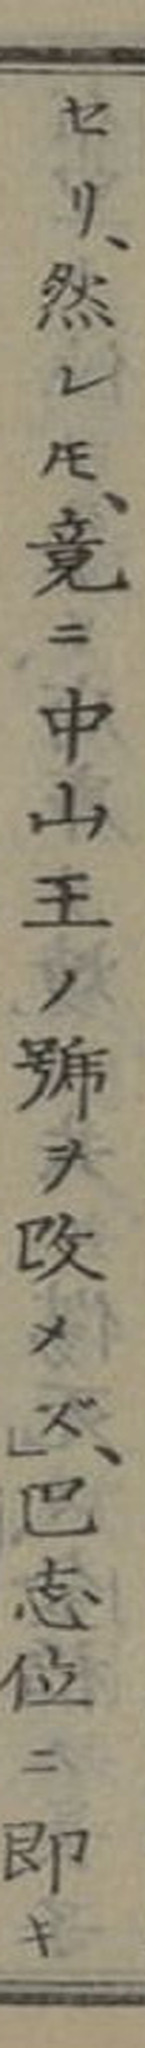セリ、然レトモ、竟ニ中山王ノ号ヲ改メズ、」巴志位ニ即キ
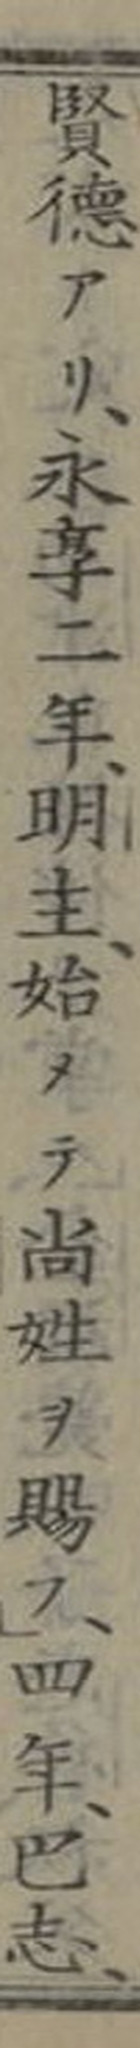賢徳アリ、永享二年、明主、始メテ尚姓ヲ賜フ、」四年、巴志、
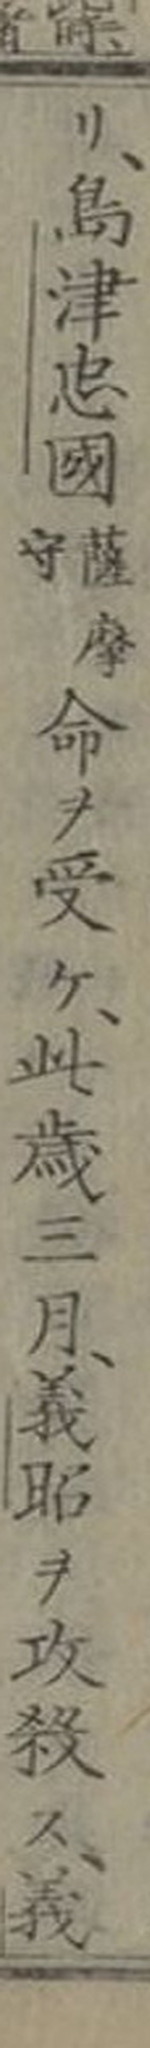リ、島津忠国薩摩守命ヲ受ケ、此歳三月、義昭ヲ攻殺ス、義

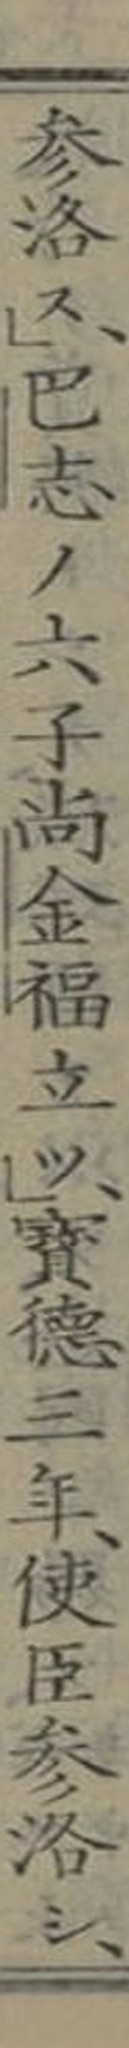参洛ス、」巴志ノ六子尚金福立ツ、」宝徳三年、使臣参洛シ、
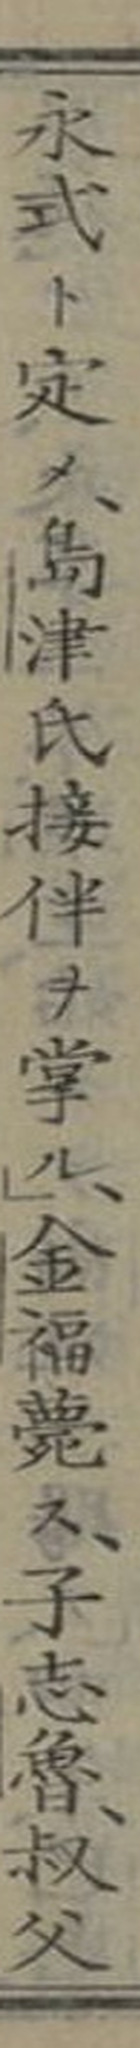永式ト定メ、島津氏接伴ヲ掌ル、」金福薧ス、子志魯、叔父
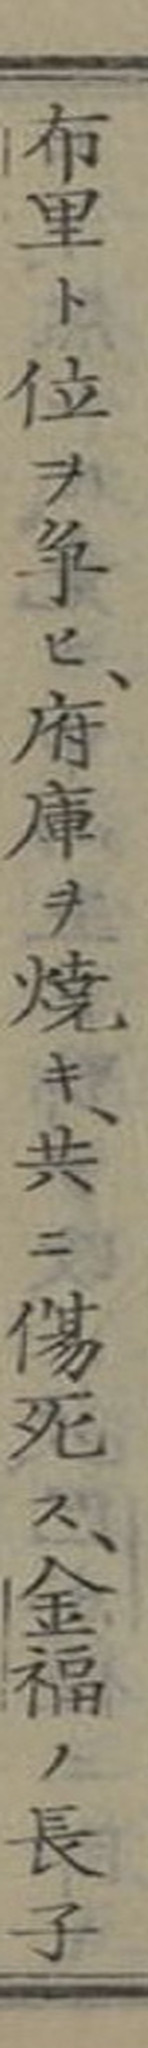布里ト位ヲ争ヒ、府庫ヲ焼キ、共ニ傷死ス、金福ノ長子
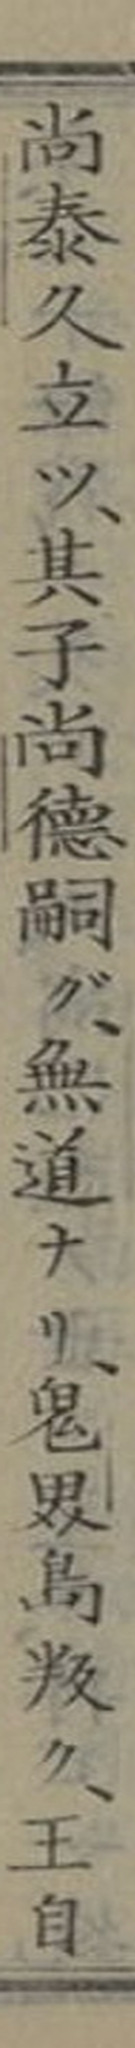尚泰久立ツ、其子尚徳嗣グ、無道ナリ、鬼界島叛ク、王自
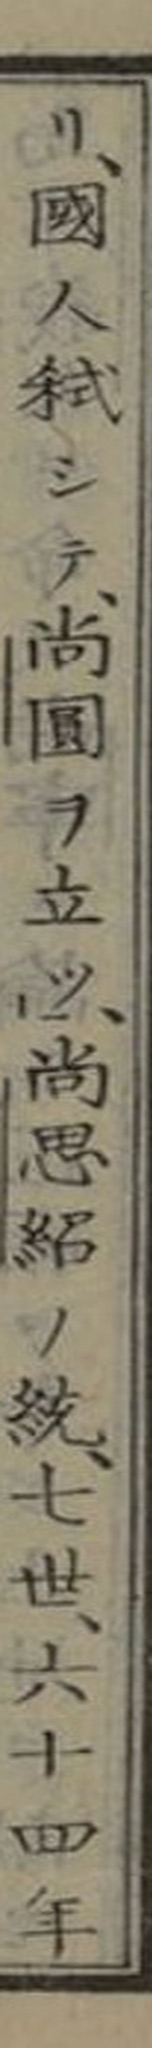リ、国人弑シテ、尚円ヲ立ツ、」尚思紹ノ統、七世、六十四年
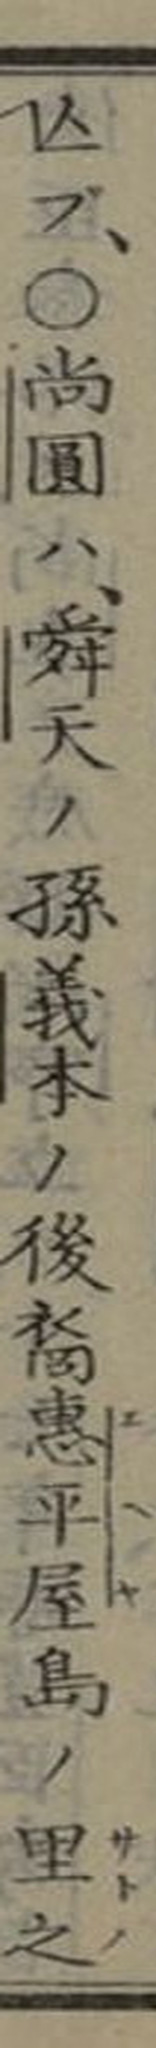亡ブ、○尚円ハ、舜天ノ孫義本ノ後裔恵平屋島ノ里之
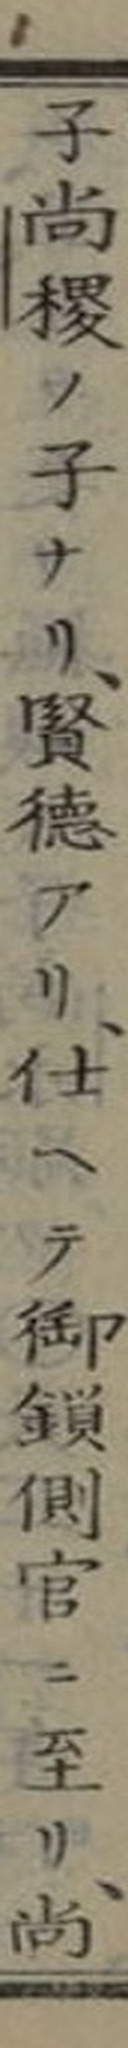子尚稷ノ子ナリ、賢徳アリ、仕ヘテ御鎖側官ニ至リ、尚
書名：琉球新誌 図附 上
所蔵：University of the Ryukyus Library
